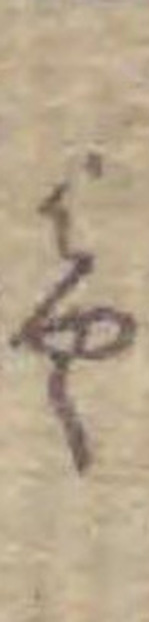はやく
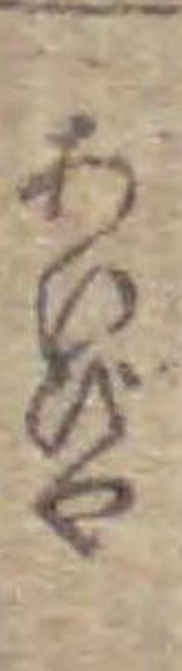あいびや

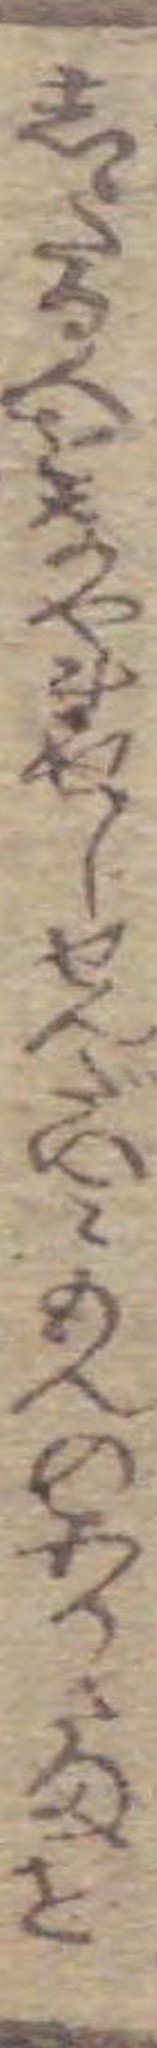しゝたる人をなやませしせんだいみもんのありさまを
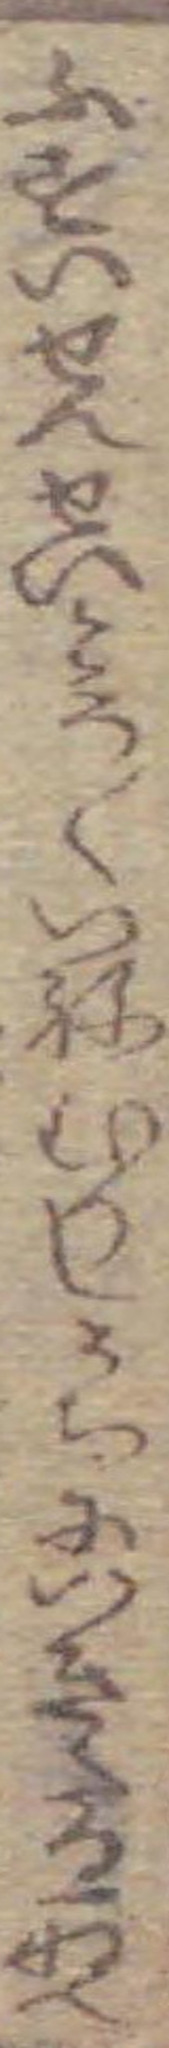ふすいせんせいとろ〳〵いねむりしうちにつきたる一ねん
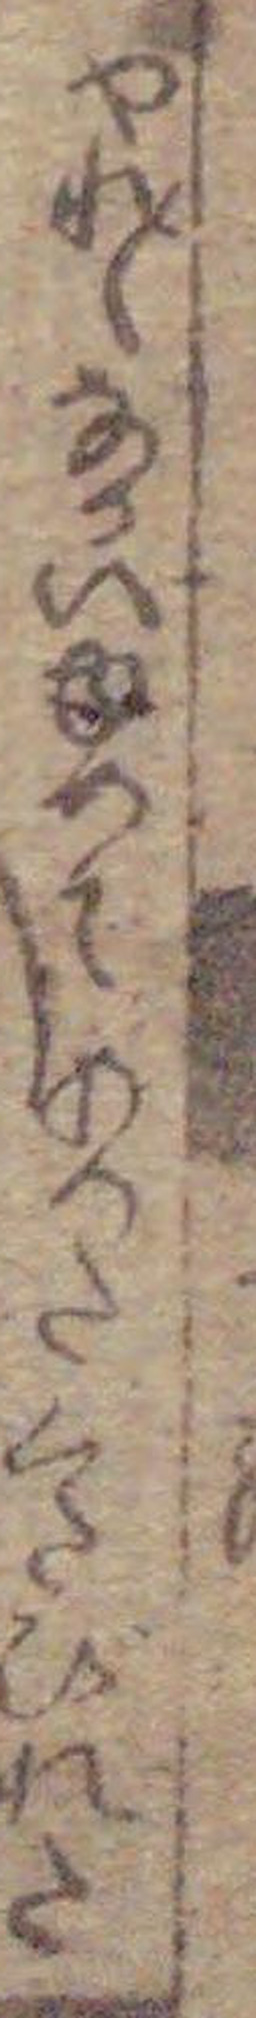やれ〳〵なかいゆめてあつたくたびれた
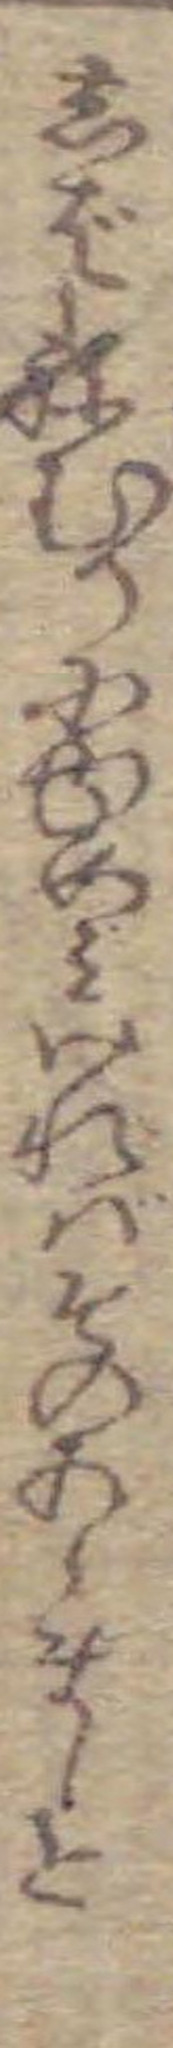しばしねむりにゆめみければそのあらましを
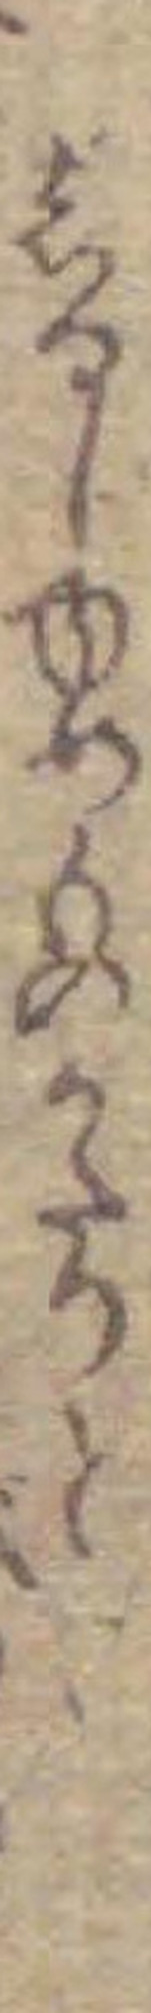しるしゆめものかたりと
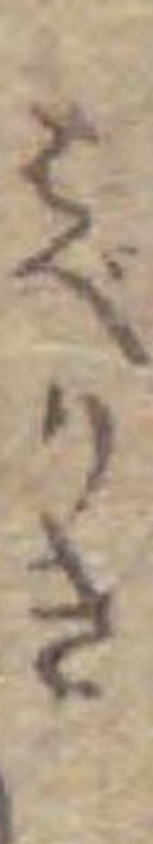はべりき
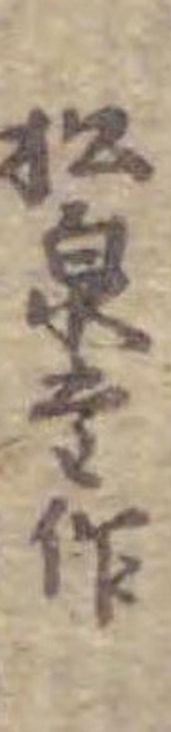松泉堂作
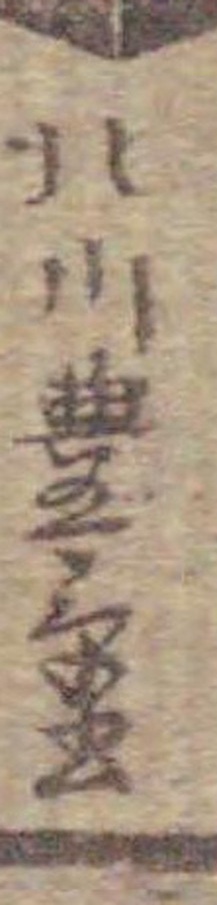北川豊章書
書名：芸者呼子鳥 : 2巻（松泉堂）
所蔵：国立国会図書館 National Diet Library, JAPAN
